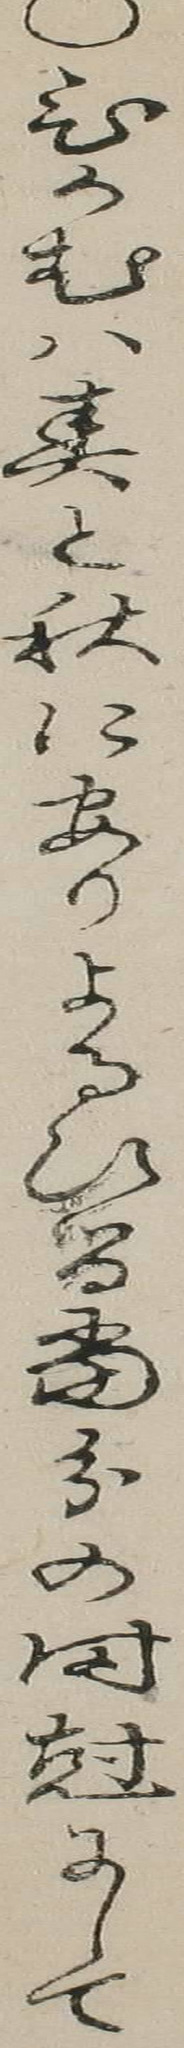○ひかむは春と秋にありよるひる当分の時剋にして
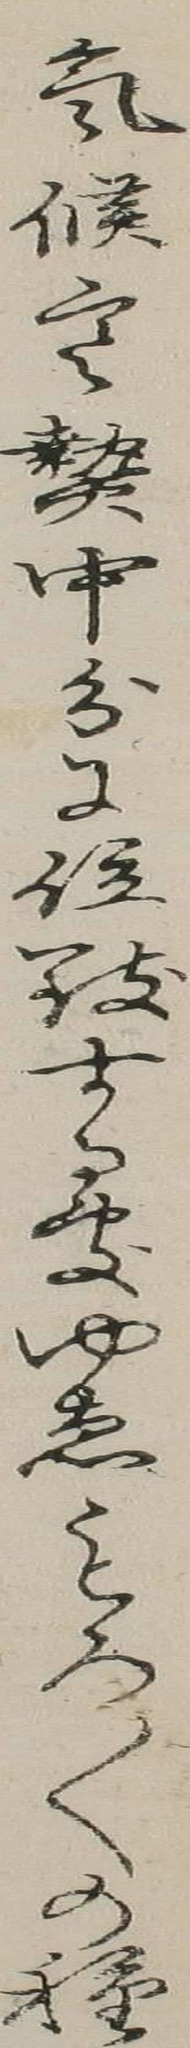気候寒熱中分に位致する処ゆゑもろ〳〵の種
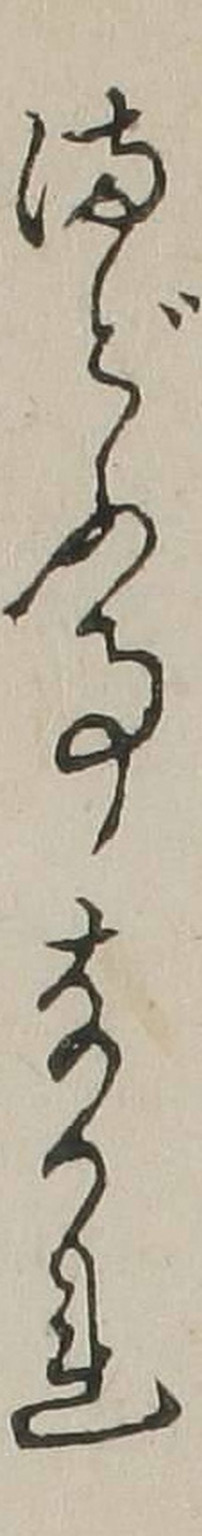まどふ事なかれ
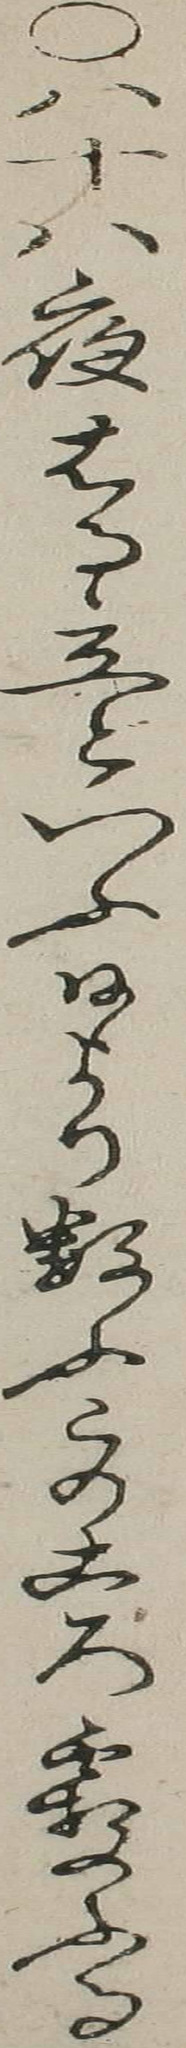○八十八夜はる立といふ日より数ふこのころ霜のふる
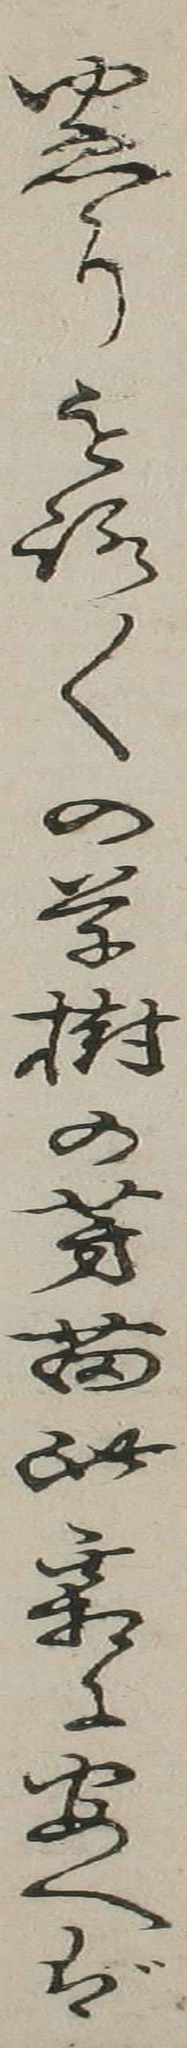ゆゑにもろ〳〵の草樹の芽苗此霜にあへば
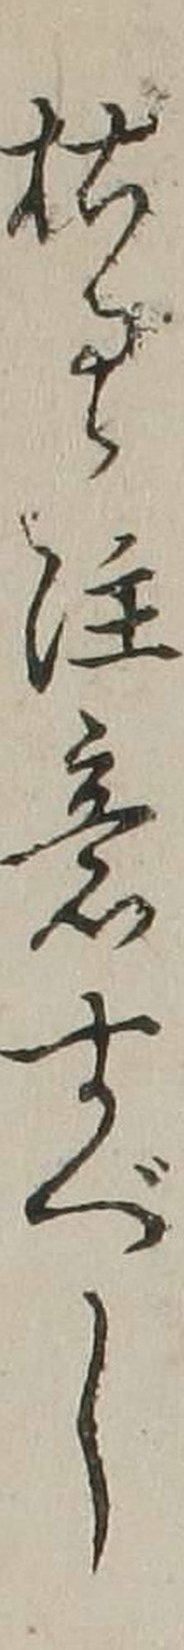枯るゝ注意すべし
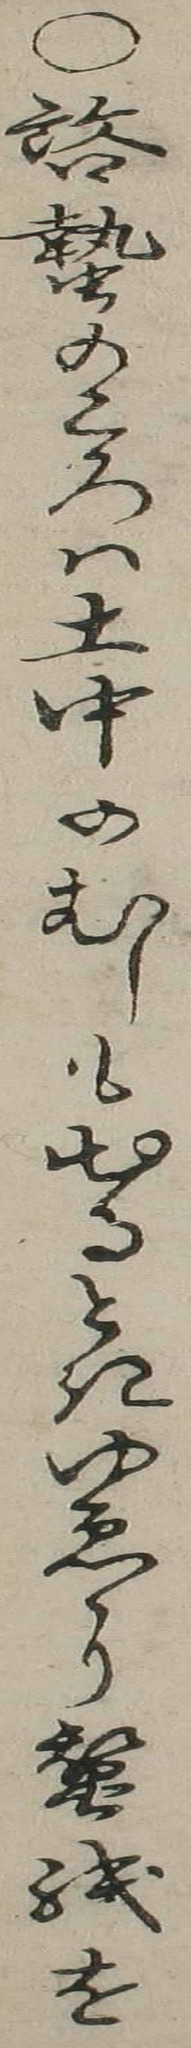○啓蟄のころは土中のむしも出るときゆゑに蚕紙を

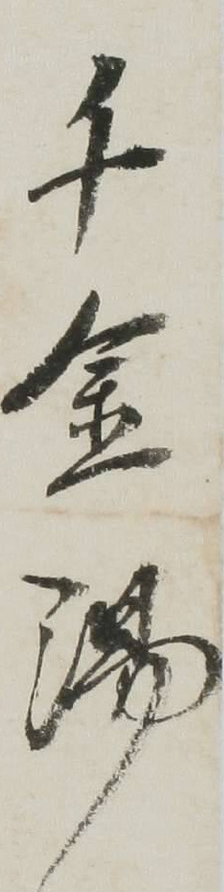千金湯
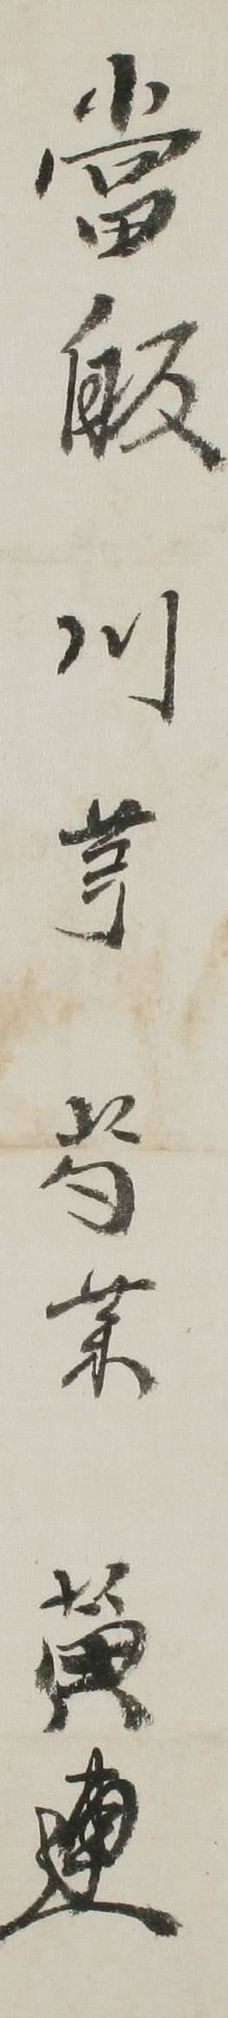当皈川芎芍薬黄連

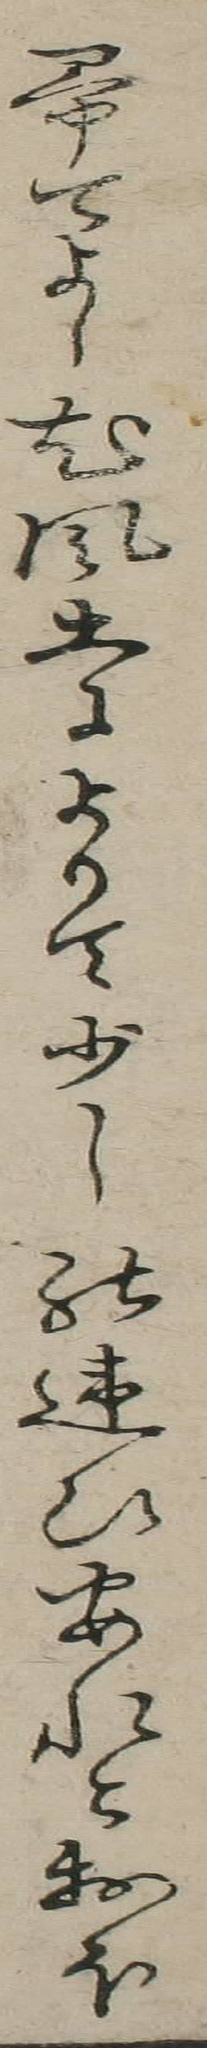帚てよし尤風土によりて少しの違ひあれとおほ
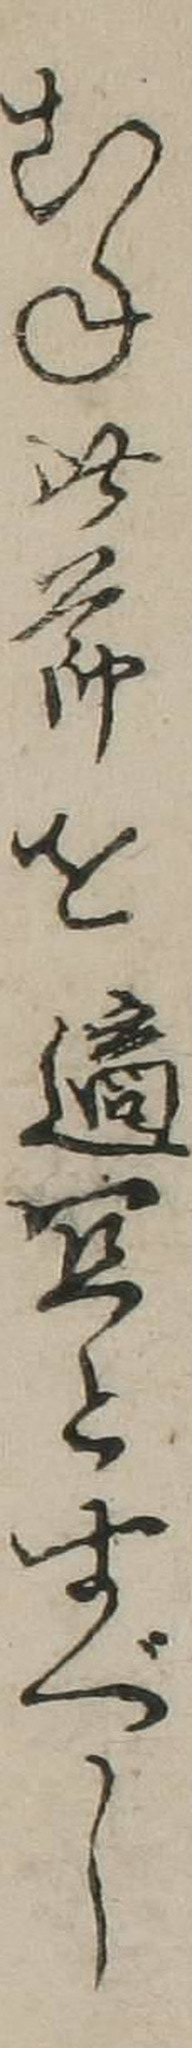むね此節を適宜とすべし
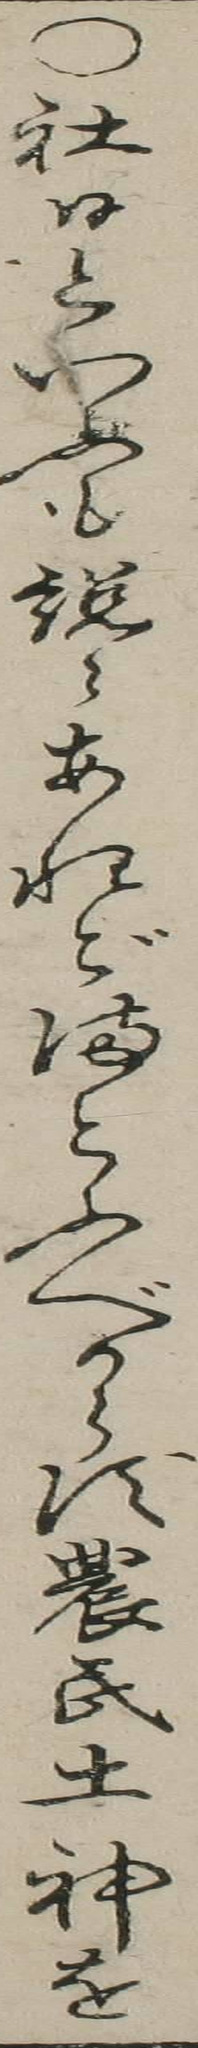○社日といふも説々あれどまとふべからず農民土神を
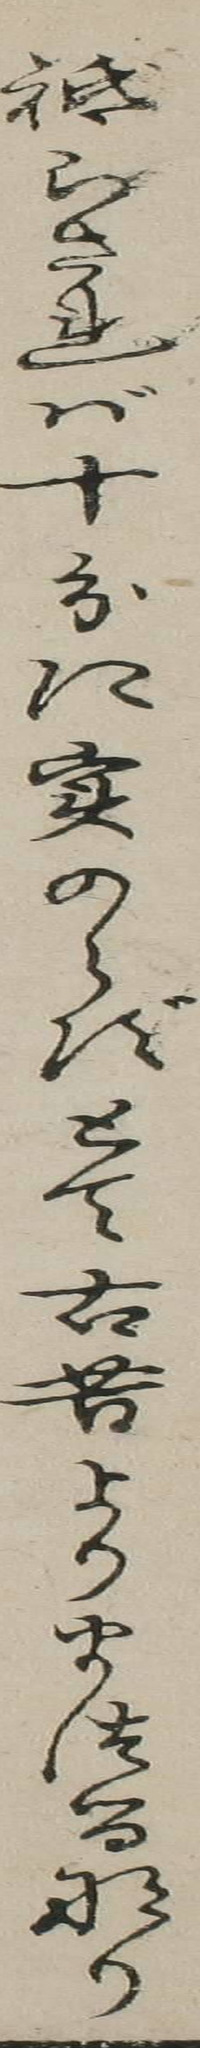祇らされば十分に実のらずとて古昔よりまつるなり
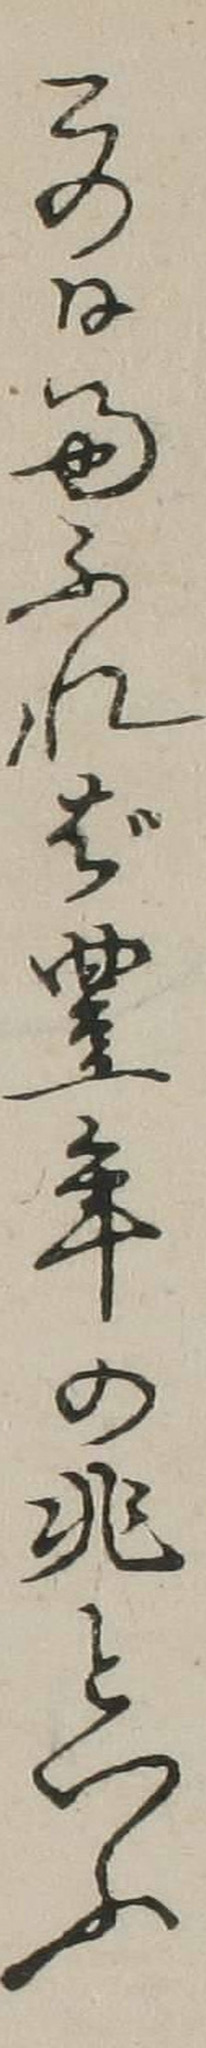この日雨ふれば豊年の兆といふ
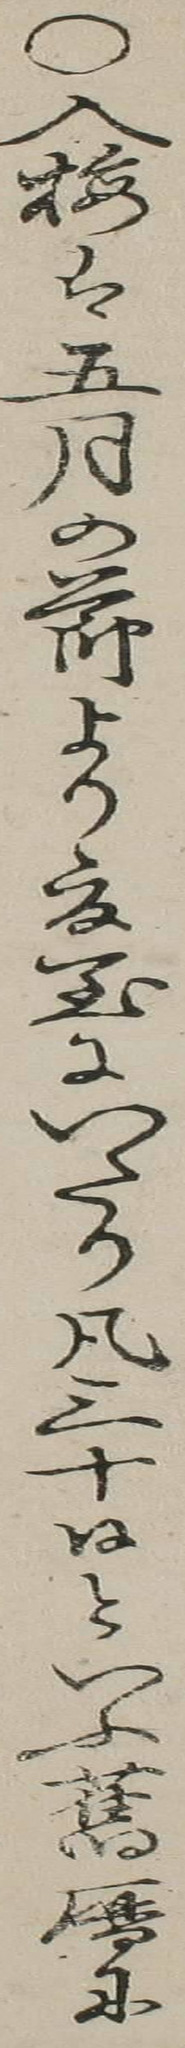○入梅は五月の節より夏至に至り凡三十日といふ旧暦に
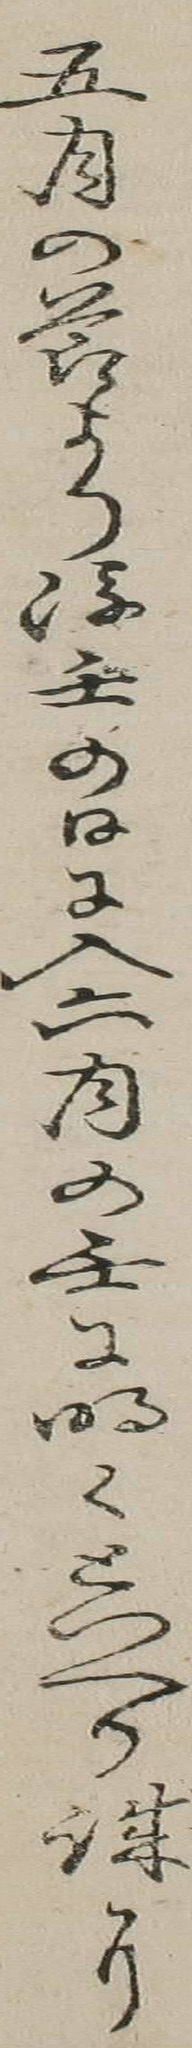五月の節より後壬の日に入六月の壬に明くといへり誠に
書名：農蠶必要日読往来
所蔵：東京学芸大学附属図書館 国文学研究資料館
